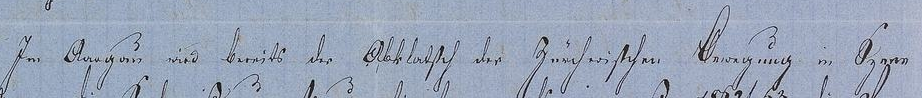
Im Aargau wird bereits der Abklatsch der Zürcherischen Bewegung in Szene
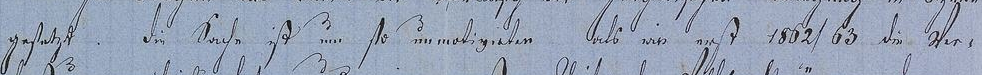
gesetzt. Die Sache ist um so unmotivirter als wir erst 1862/63 die Ver-
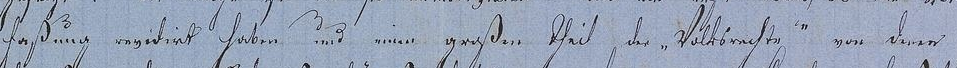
faßung revidirt haben und einen großen Theil der «Volksrechte» von denen
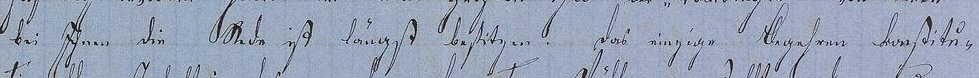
bei Ihnen die Rede ist längst besitzen. Das einzige Begehren konstitu-
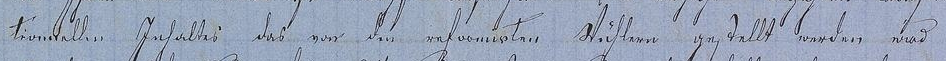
tionellen Inhaltes das von den reformirten Wählern gestellt werden wird
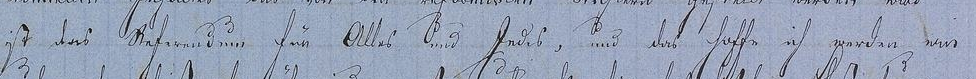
ist das Referendum für Alles und Jedes, und das hoffe ich werden wir
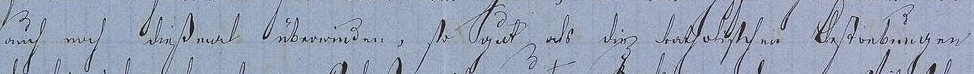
auch noch dießmal überwinden, so gut als die katholischen Bestrebungen
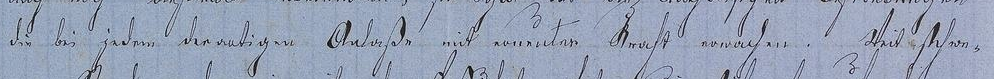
die bei jedem der derartigen Anlaße mit erneuter Kraft erwachen. Weit schwe-
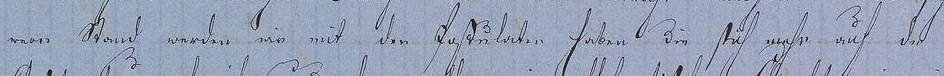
rern Stand werden wir mit den Postulaten haben die sich mehr auf die
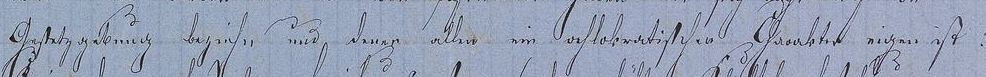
Gesetzgebung beziehn und denen allen ein ochlokratischer Charakter eigen ist:
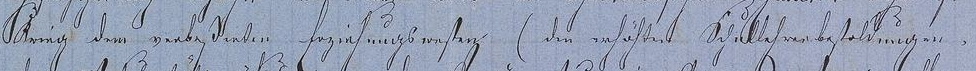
Krieg dem verbeßerten Erziehungswesen (den erhöhten Schullehrerbesoldungen,
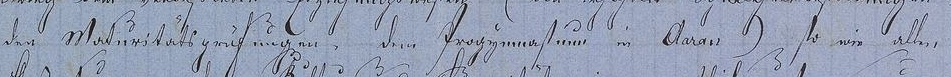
den Maturitätsprüfungen, dem Progymnasium in Aarau) so wie allen
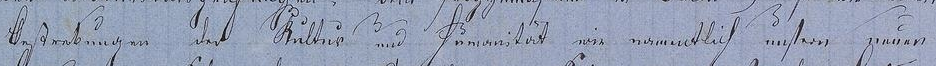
Bestrebungen der Kultur und Humanität wie namentlich unsern neuen
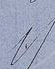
ver-
